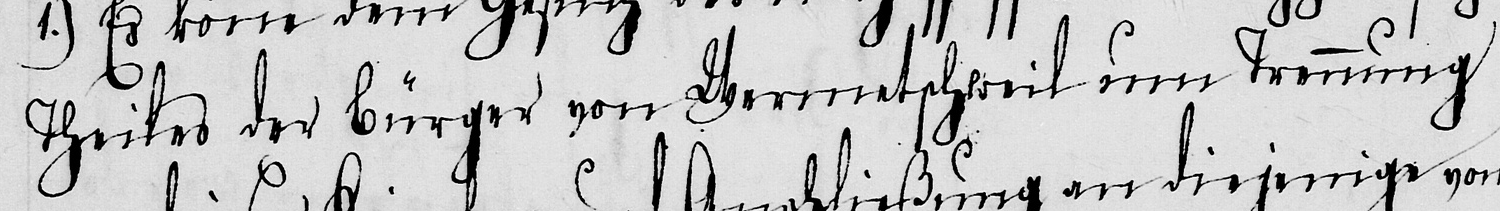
Theiles der Bürger von Wermetschweil um Trennung
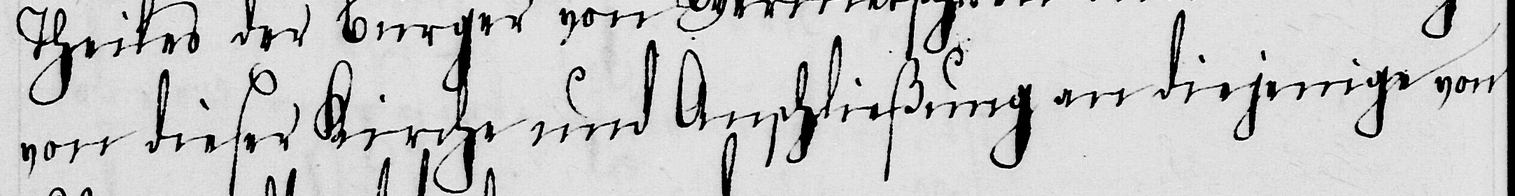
von dieser Kirche und Anschließung an diejenige von
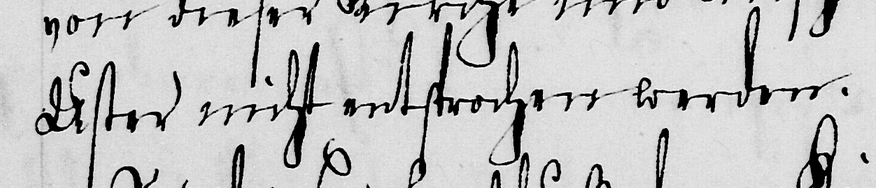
Uster nicht entsprochen werden.
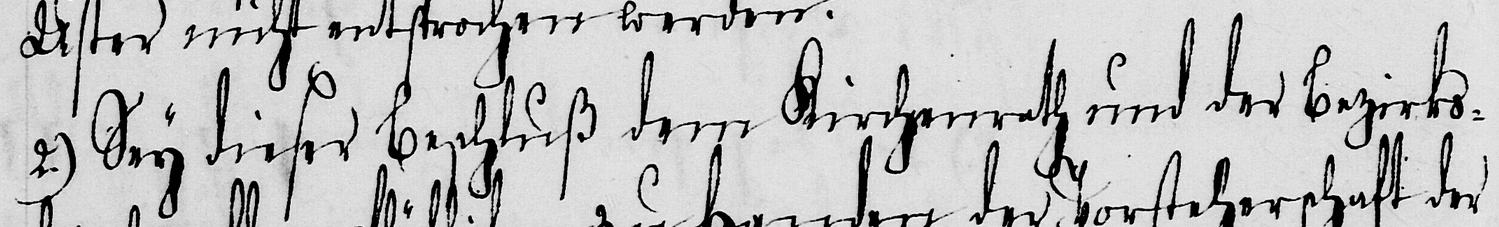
2.) Sey dieser Beschluß dem Kirchenrath und der Bezirks¬
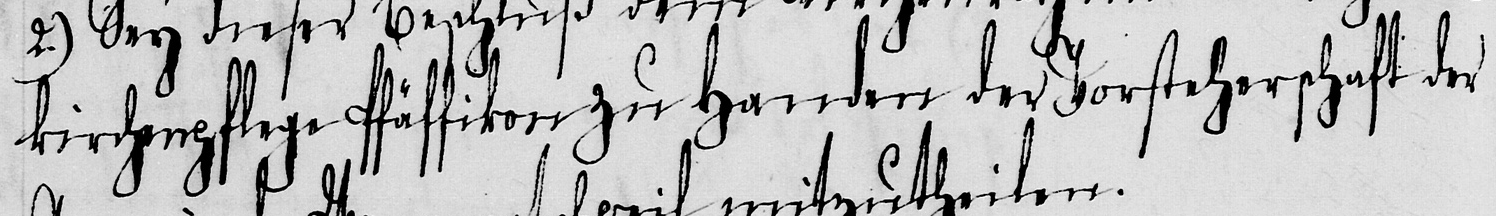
kirchenpflege Pfäffikon zu Handen der Vorsteherschaft der
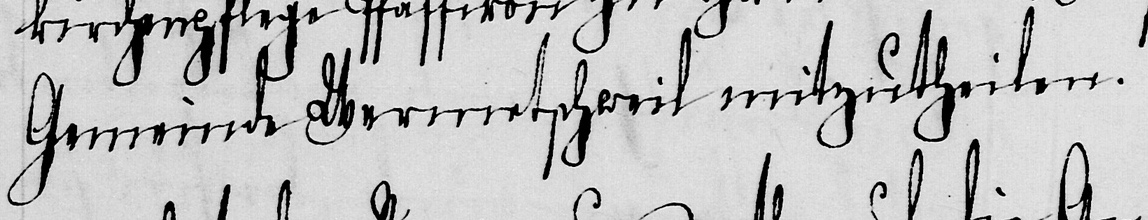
Gemeinde Wermetschweil mitzutheilen.
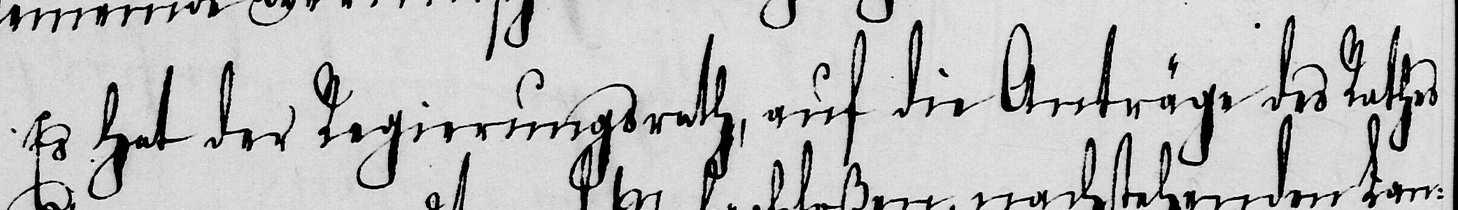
Es hat der Regierungsrath, auf die Anträge des Rathes
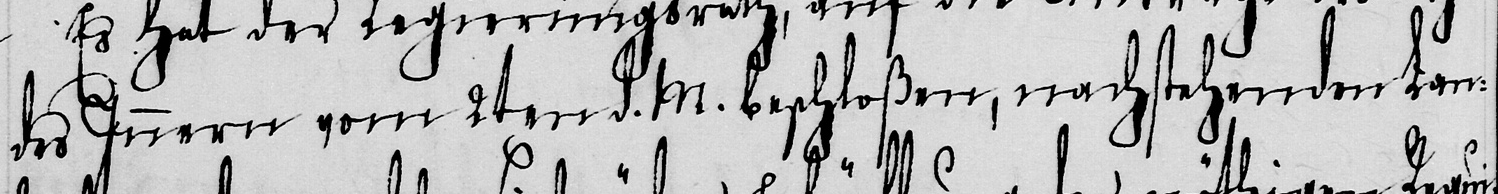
des Innern vom 2ten d. M. beschloßen, nachstehenden Lan¬
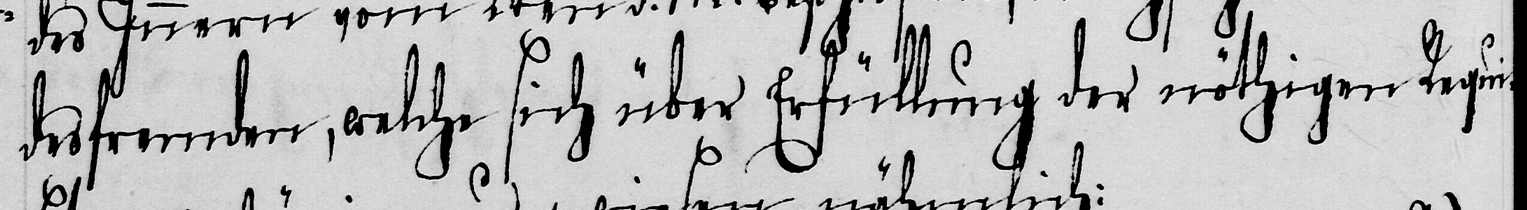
desfremden, welche sich über Erfüllung der nöthigen Requ¬
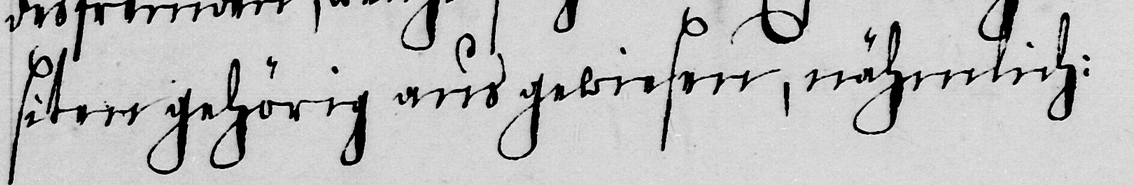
isiten gehörig ausgewiesen, nähmlich:
